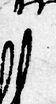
te
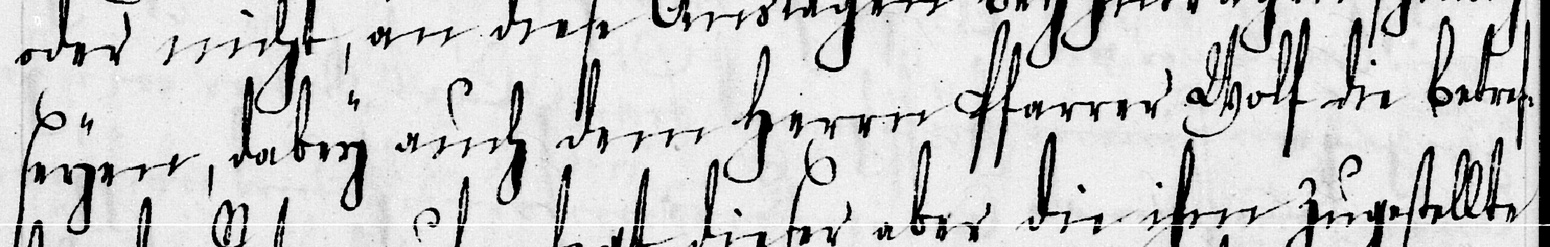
seyen, dabey auch dem Herrn Pfarrer Wolf die betre¬
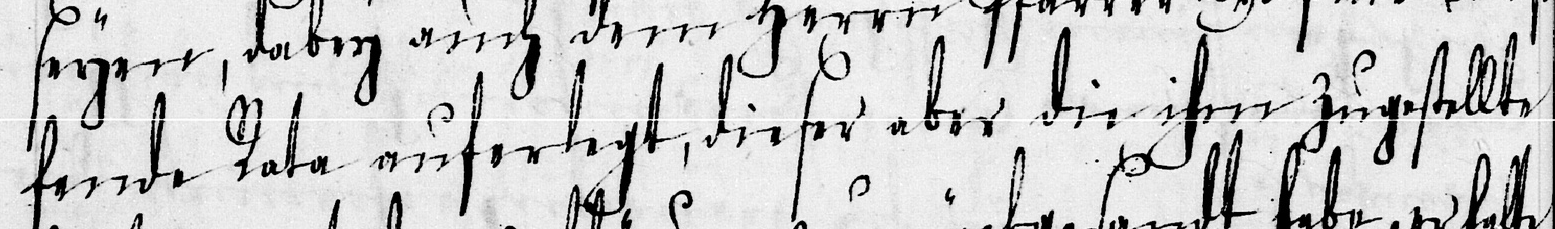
fende Rata auferlegt, dieser aber die ihm zugestell¬
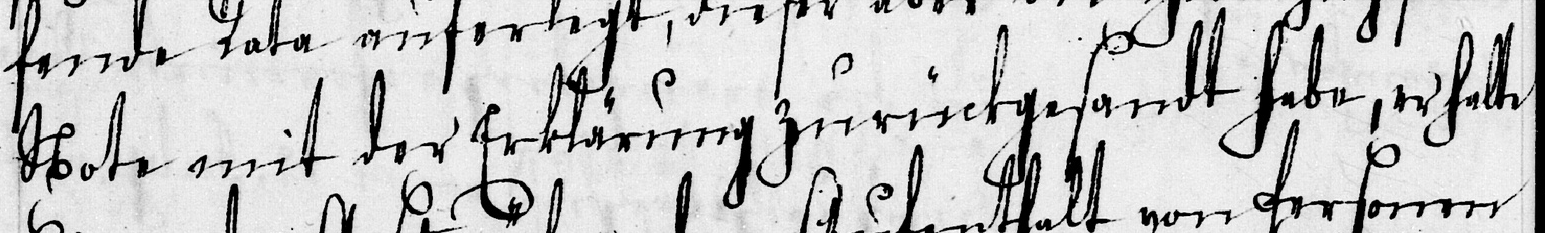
Note mit der Erklärung zurückgesandt habe, er hal¬
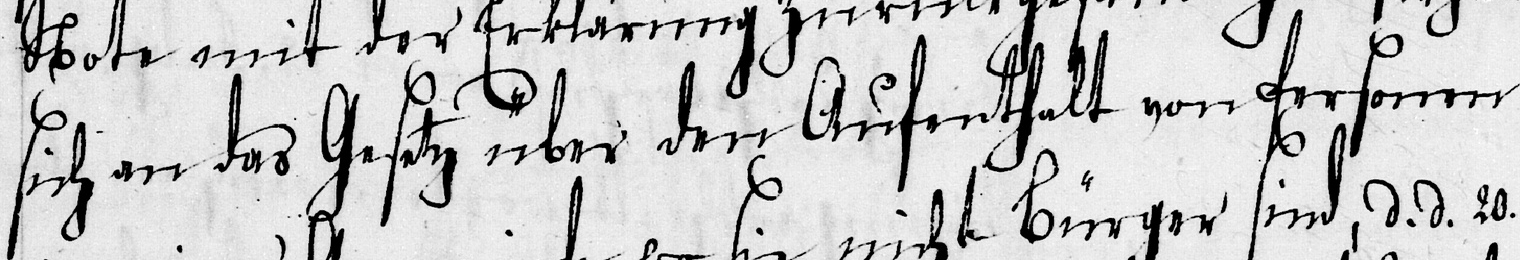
ch an das Gesetz über den Aufenthalt von Personen
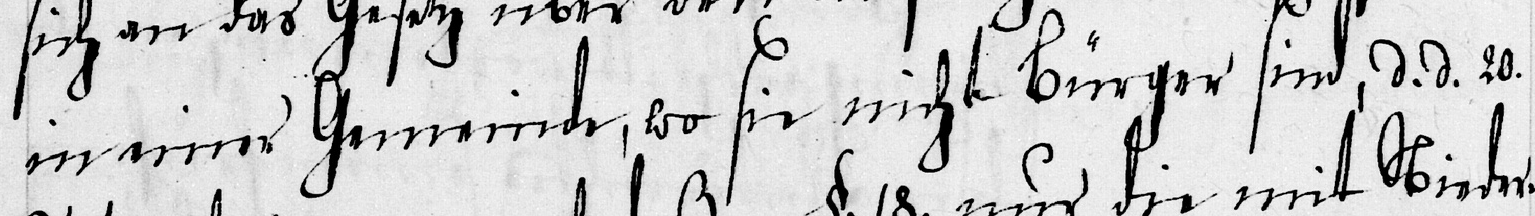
in einer Gemeinde, wo sie nicht Bürger sind, d. d. 20.
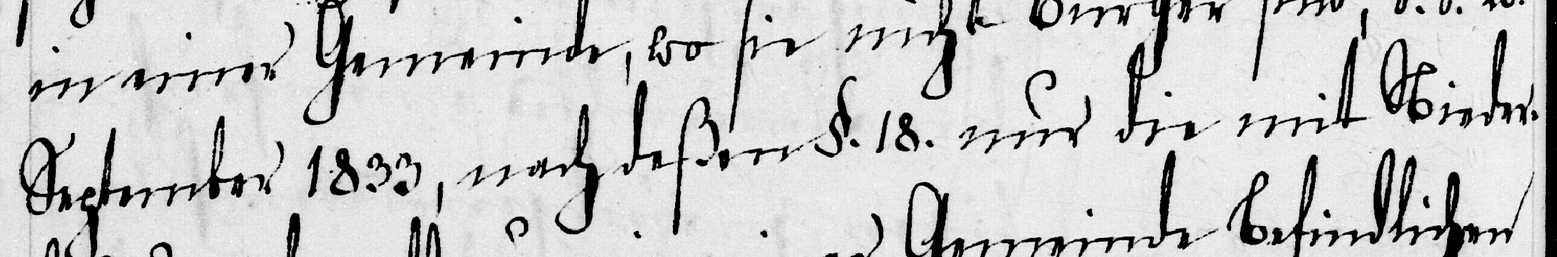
September 1833, nach deßen §. 18. nur die mit Nieder¬
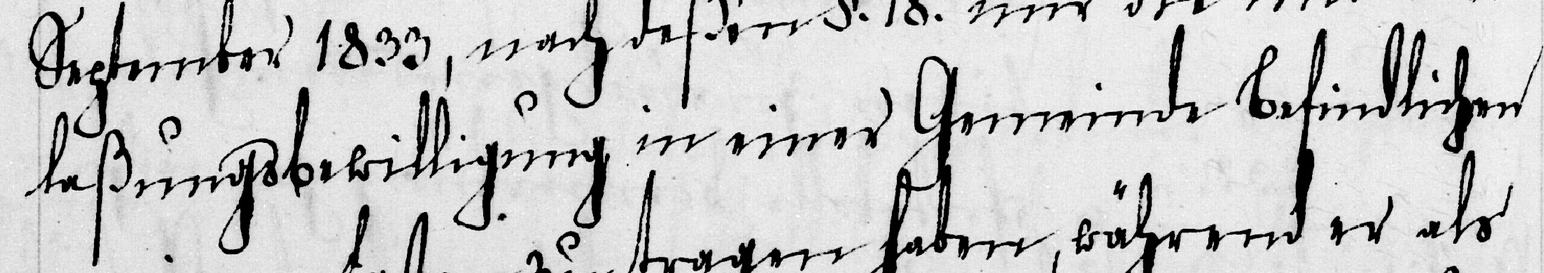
laßungsbewilligung in einer Gemeinde befindlichen
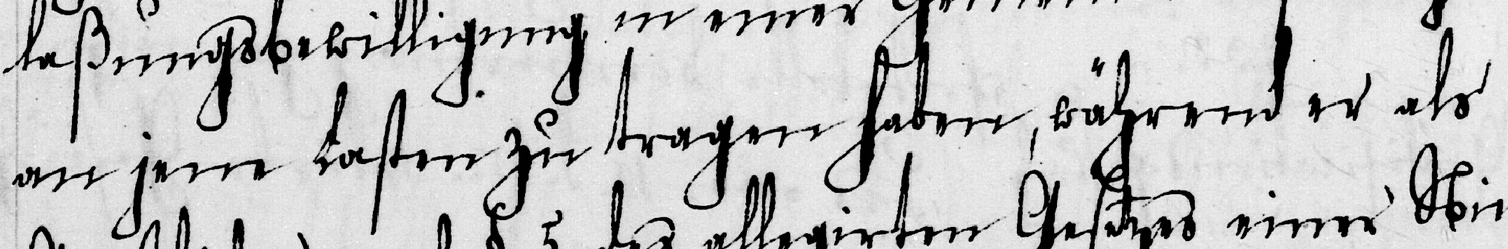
an jene Lasten zu tragen haben, während er als
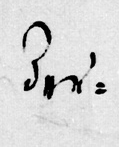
der
